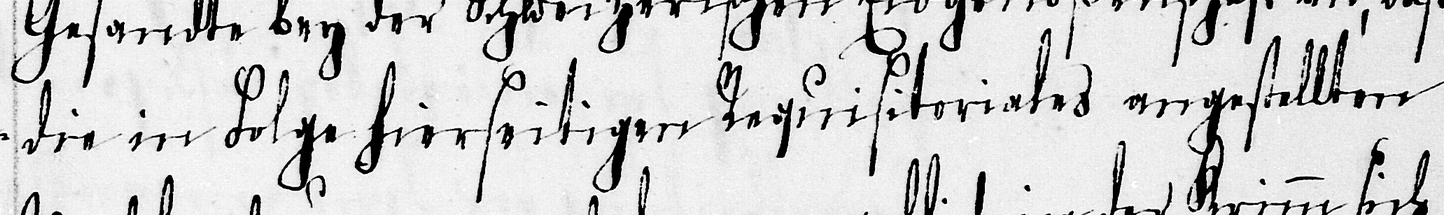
die in Folge hierseitigen Requisitoriales angestellten
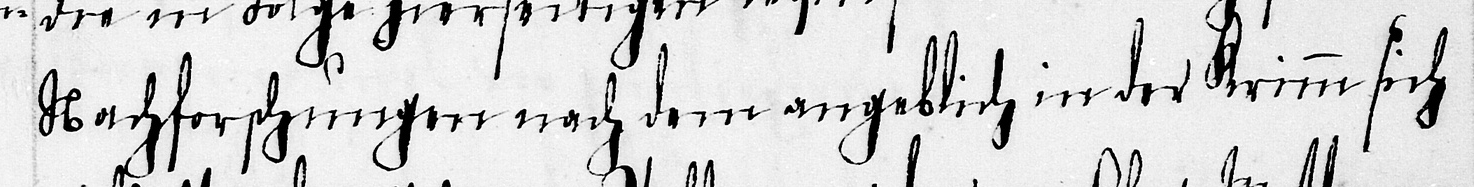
Nachforschungen nach dem angeblich in der Krimm sich
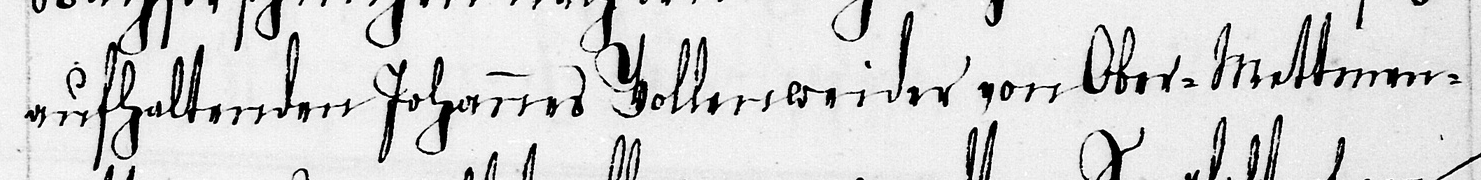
aufhaltenden Johannes Vollenweider von Ober-Mettmen¬
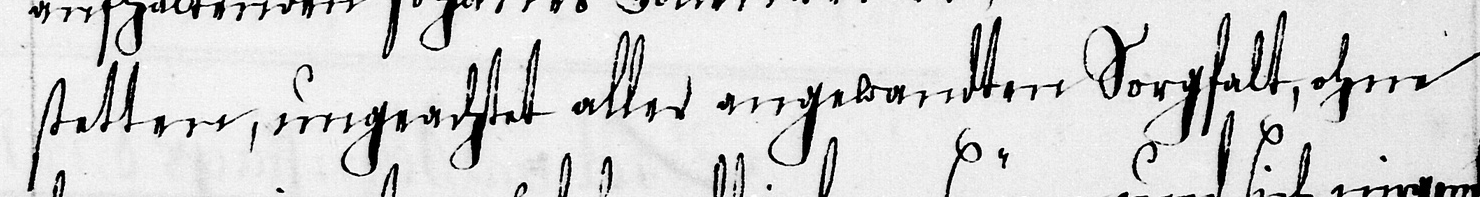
stetten, ungeachtet aller angewandten Sorgfalt, ohne
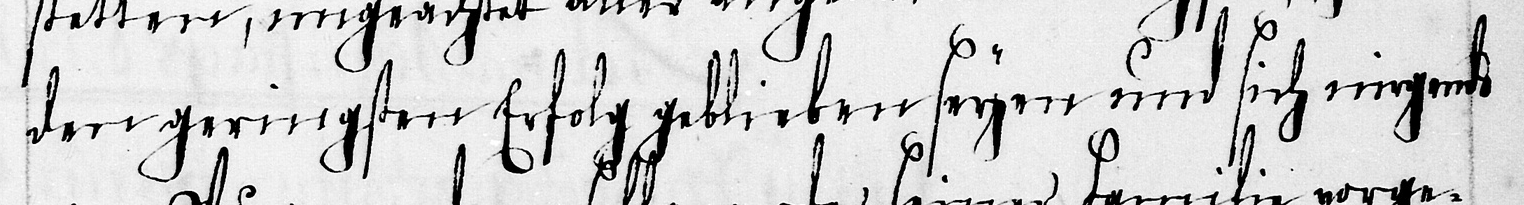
den geringsten Erfolg geblieben seyen und sich nirgends
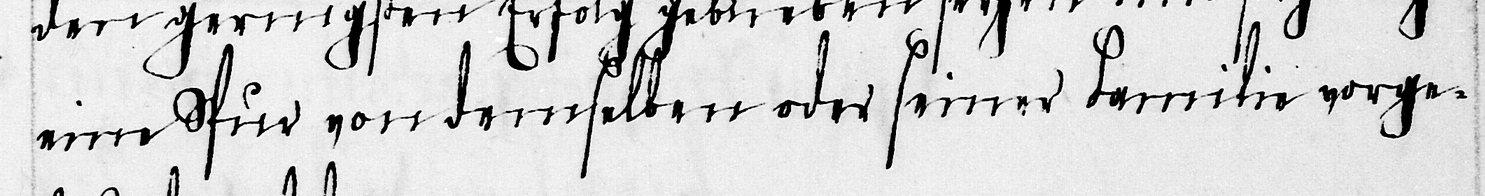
eine Spur von demselben oder seiner Familie vorge¬
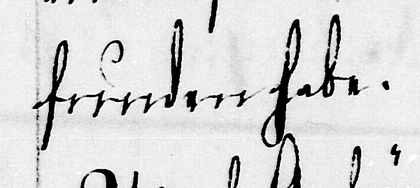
funden habe.
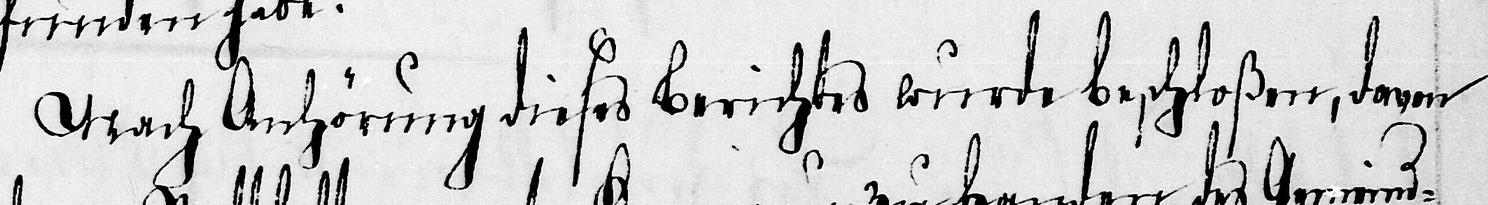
Nach Anhörung dieses Berichtes wurde beschloßen, davon
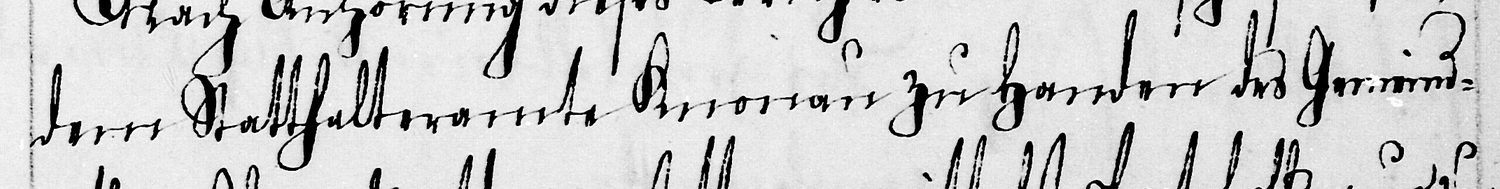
dem Statthalteramte Knonau zu Handen des Gemeind¬
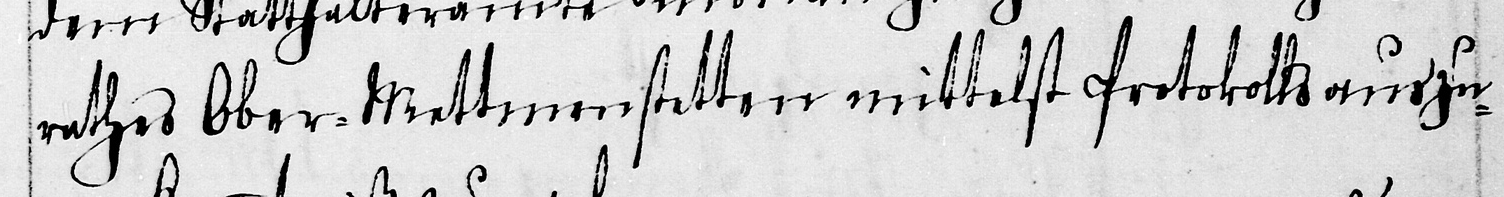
rathes Ober-Mettmenstetten mittelst Protokollsauszu¬
